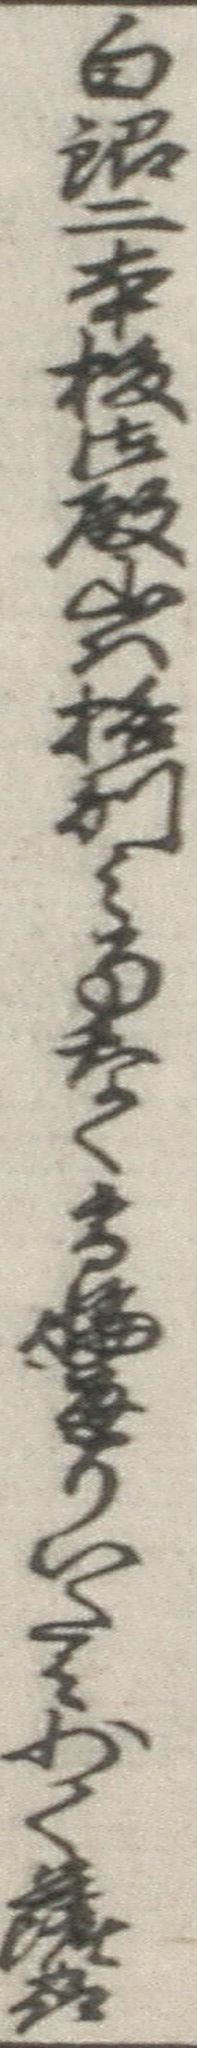白銀二本榎御殿山ハ格別の事なく高輪通りいたミ少く薩州
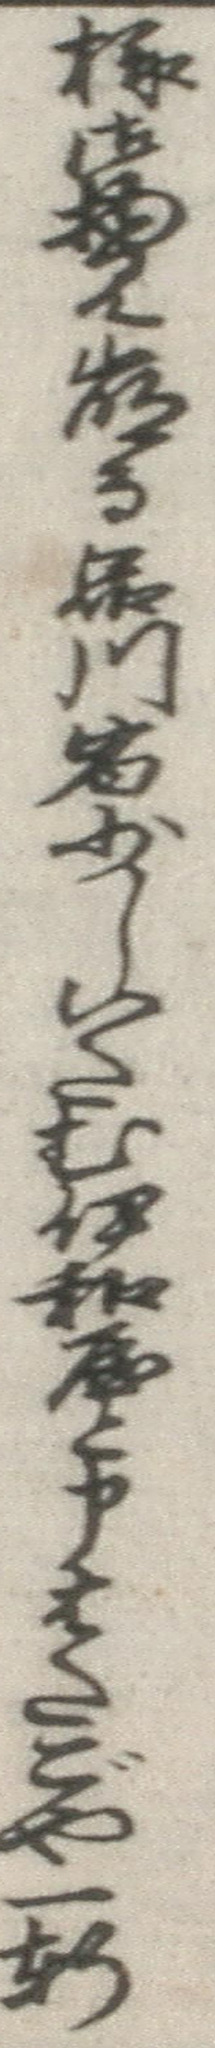様御物見崩る品川宿少しいたむ伊和屋と申はたごや一軒
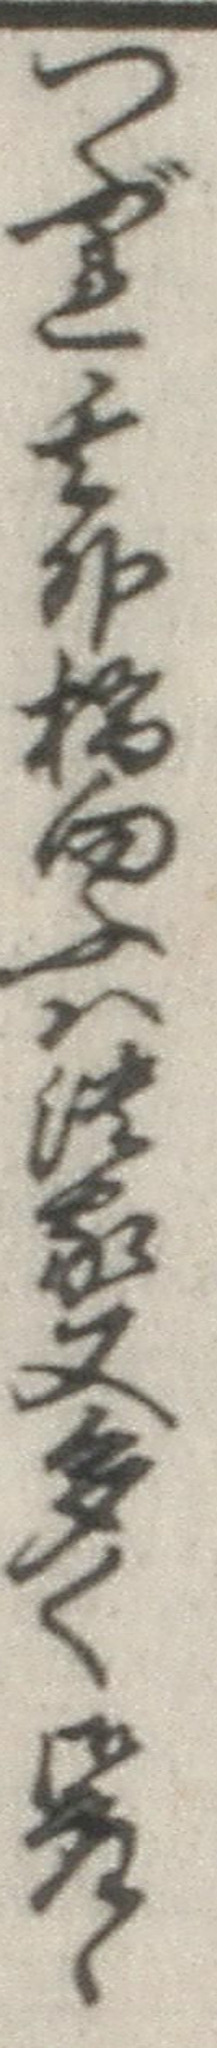つぶれ其外橋向ふハ潰家又多く御座候
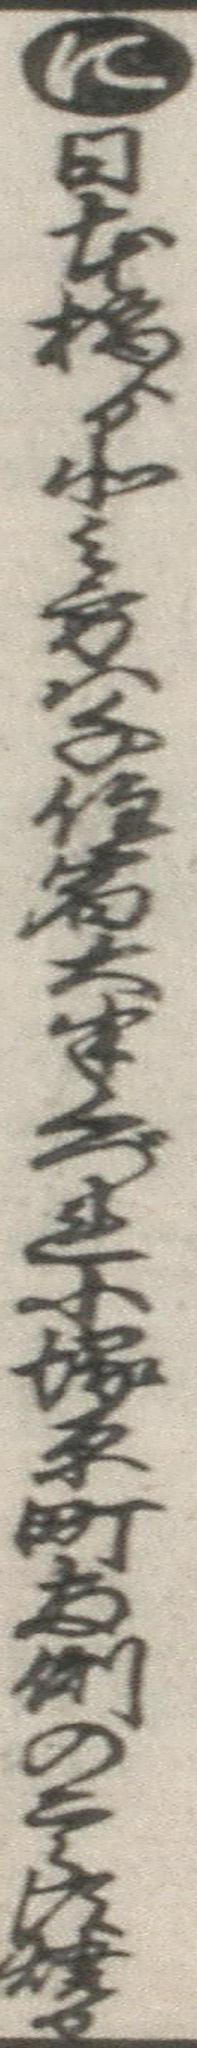に日本橋ゟ北之方ハ千住宿大半くづれ小塚原町両側のこらす焼る
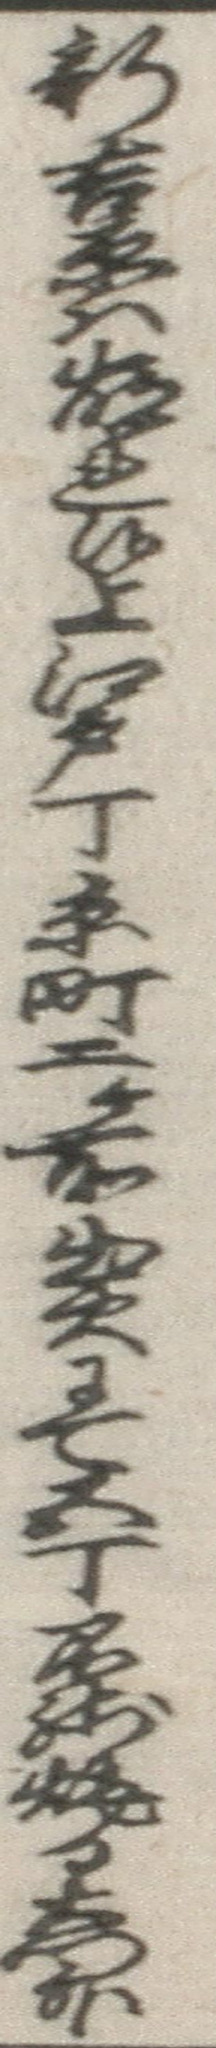新吉原ハ崩れ候上江戸丁京町二ケ所出火にて五丁不残焼る大門外
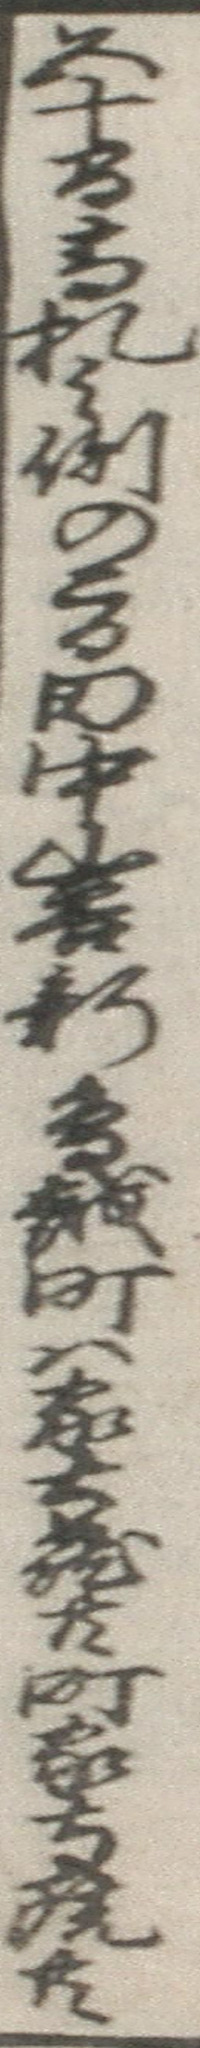五十間高札之側のこる田中山谷新鳥越町ハ家土蔵共町家寺院共
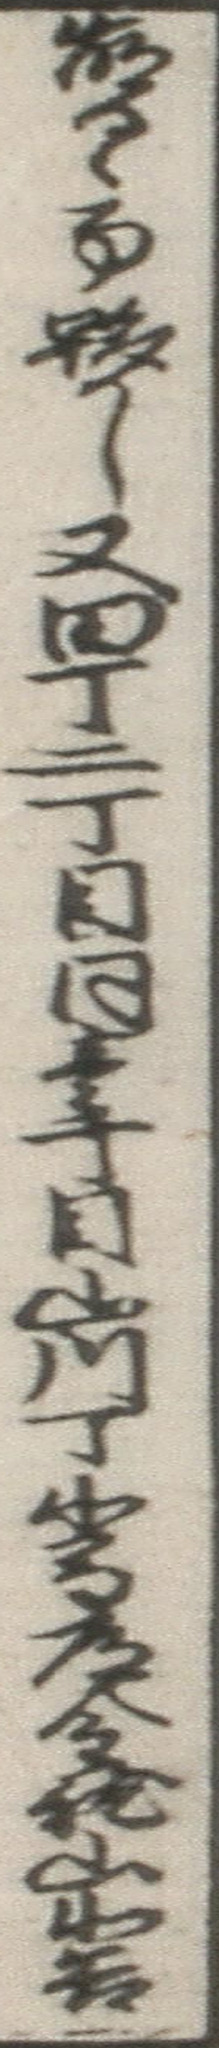崩るゝ事夥し又田丁二丁目同壱丁目山川丁北馬道金龍山北谷
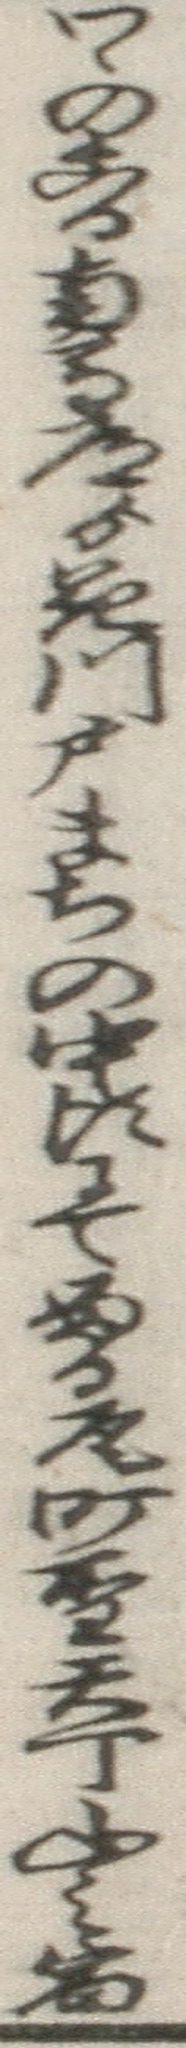ツヽのこる南馬道ゟ花川戸まちの中頃にて留る瓦町聖天丁山之宿
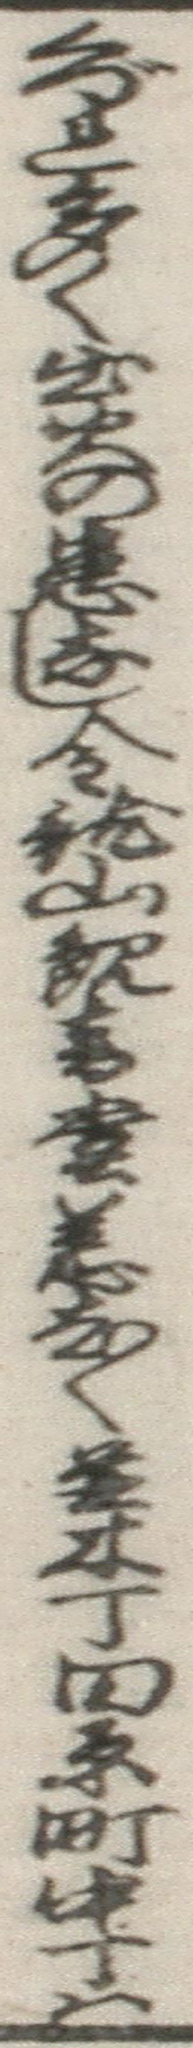くづれ多く出火の患なし金龍山観音堂恙なく並木丁田原町中丁ハ
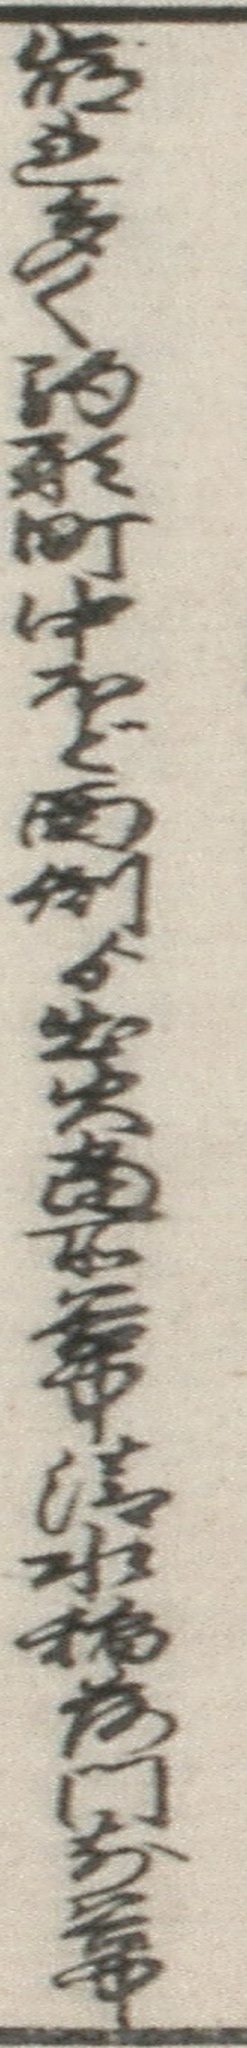崩れ多く駒形町中ほど西側ゟ出火当所谷中清水稲荷門前谷中
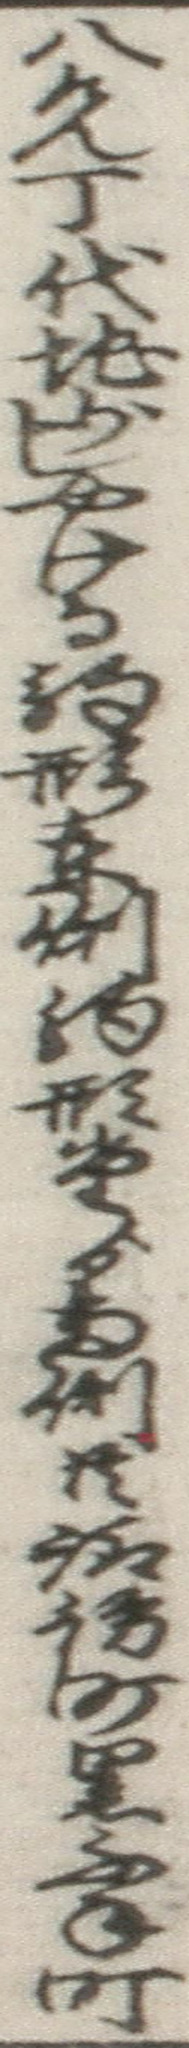八けん丁代地少しやける駒形東側駒形堂ゟ両側共諏訪町黒ふね町
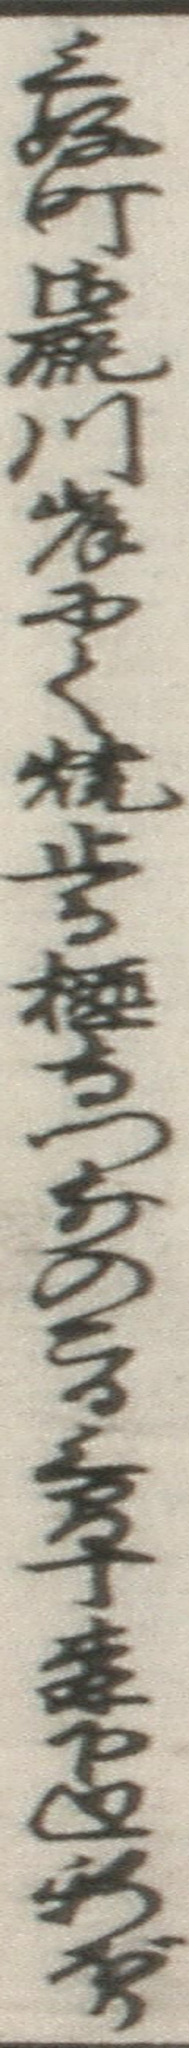三好町御厩川岸にて焼止る榧寺門前のこる三間丁森下辺新ぼり
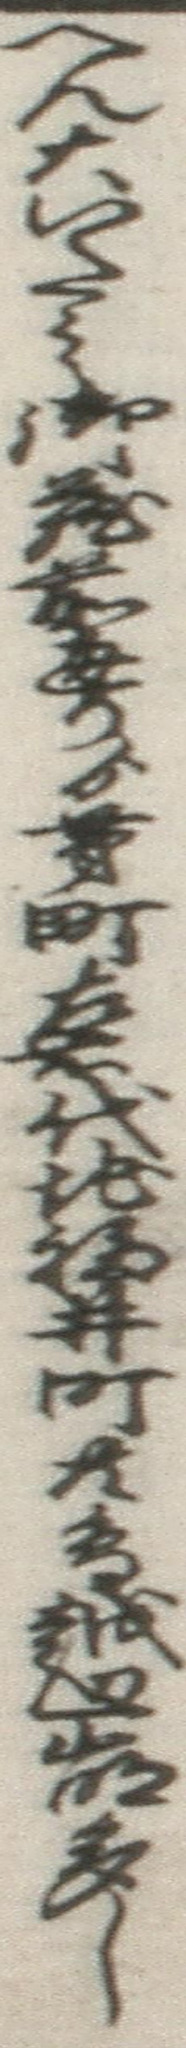へん大いたミ御蔵前通りゟ茅町左右代地福井町共鳥越辺崩多し
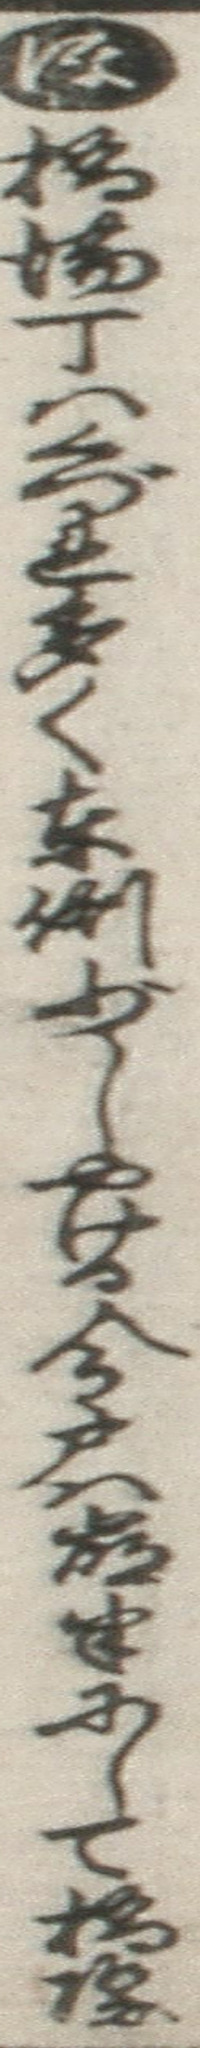ほ橋場丁ハくづれ多く東側少しやける今戸ハ崩半にして橋際
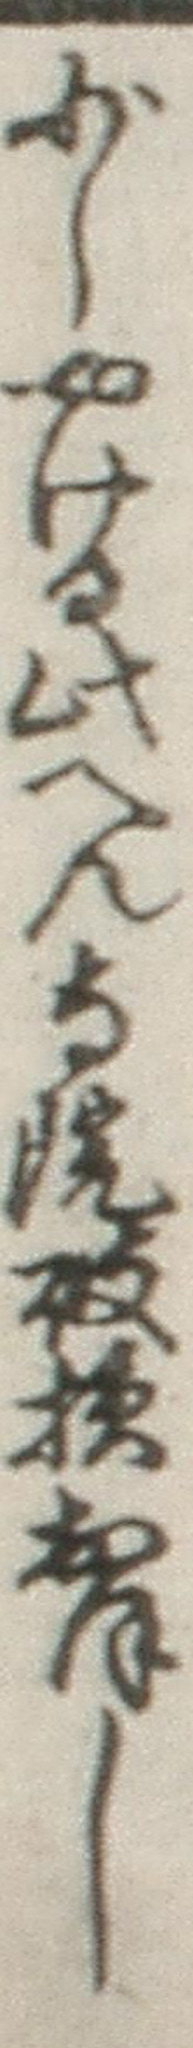少しやける此へん寺院破損おほし

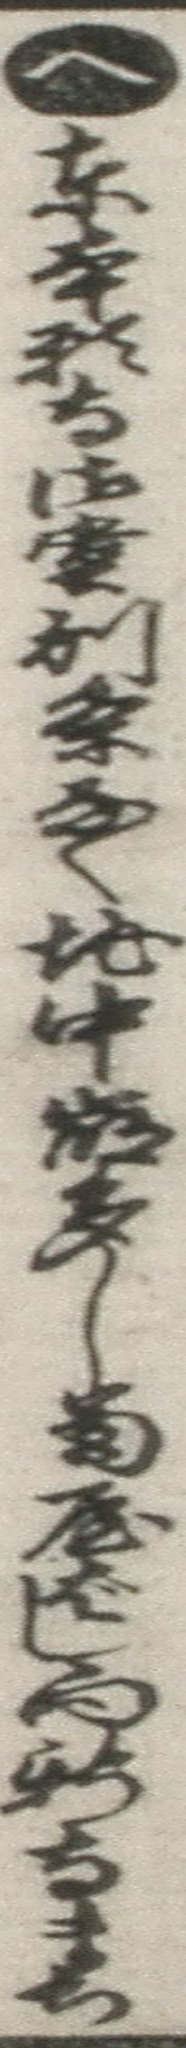へ東本願寺御堂別条なく地中崩多し菊屋ばし向新寺まち
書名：大地震焼場細見記
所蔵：東京大学地震研究所図書室 Earthquake Research Institute Library, The University of Tokyo, JAPAN
